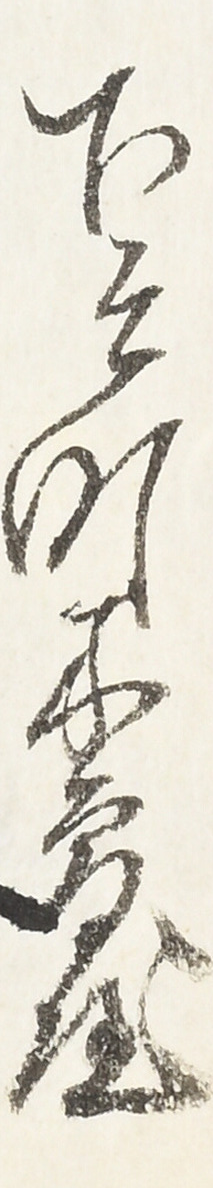下モ町木曽屋
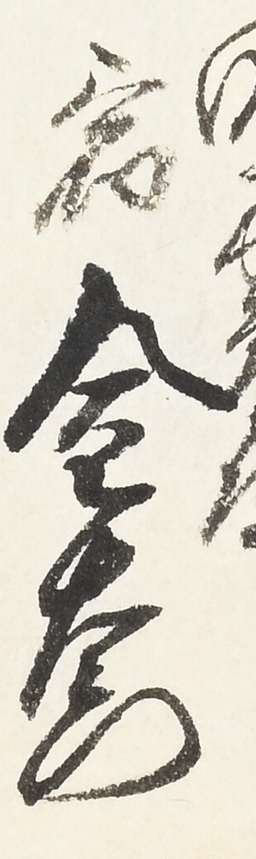宿金右衛門
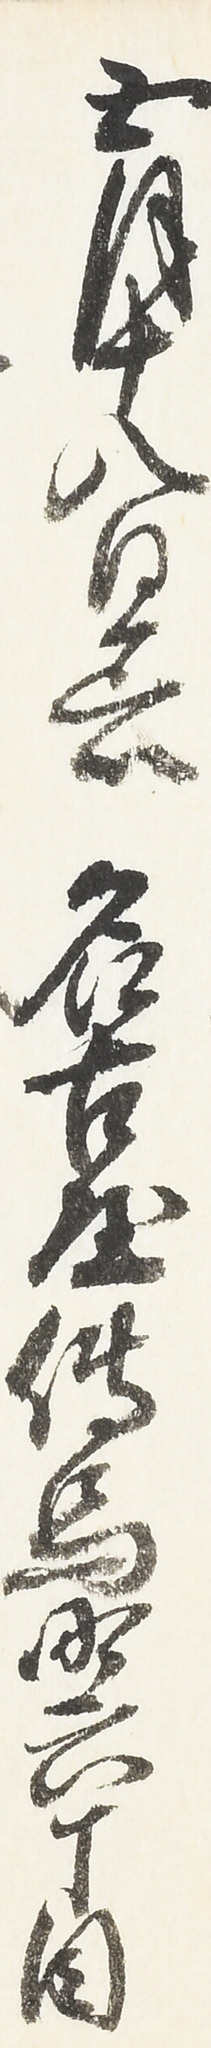五月十八日着名古屋伝馬町六丁目
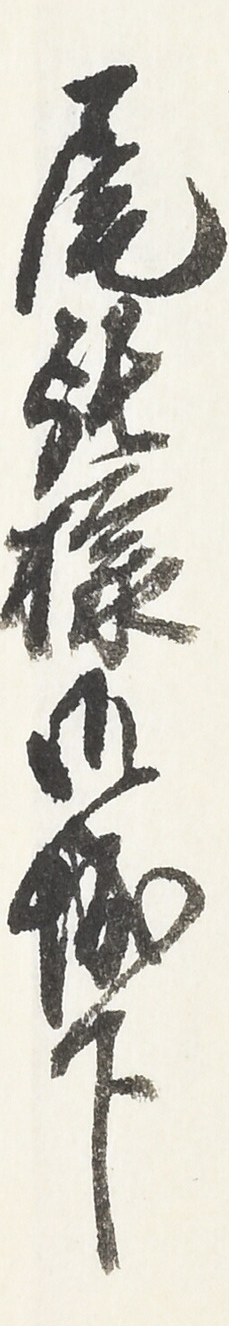尾張様御城下
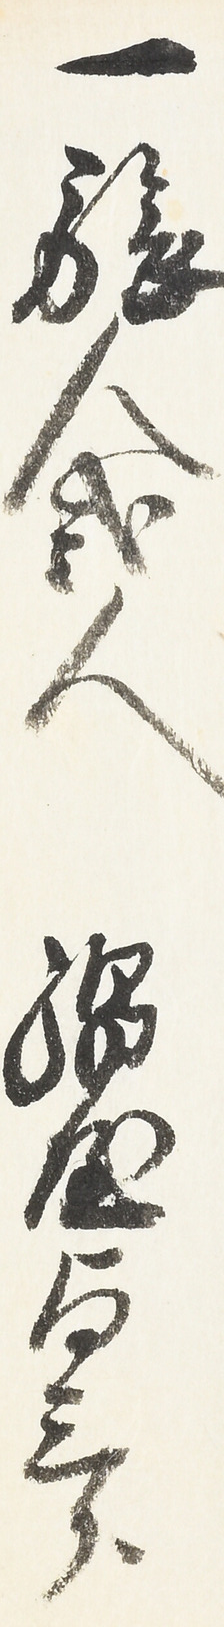一旅人弐人縄屋与三郎
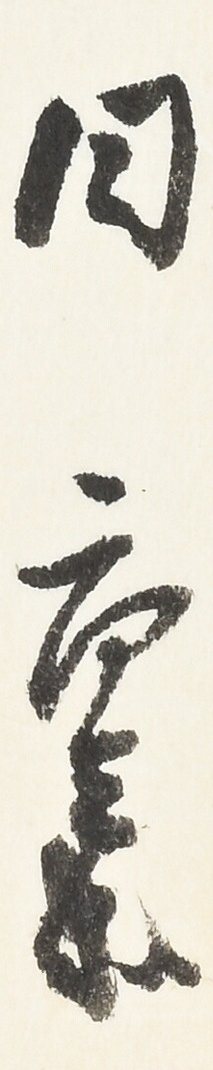同市兵衛
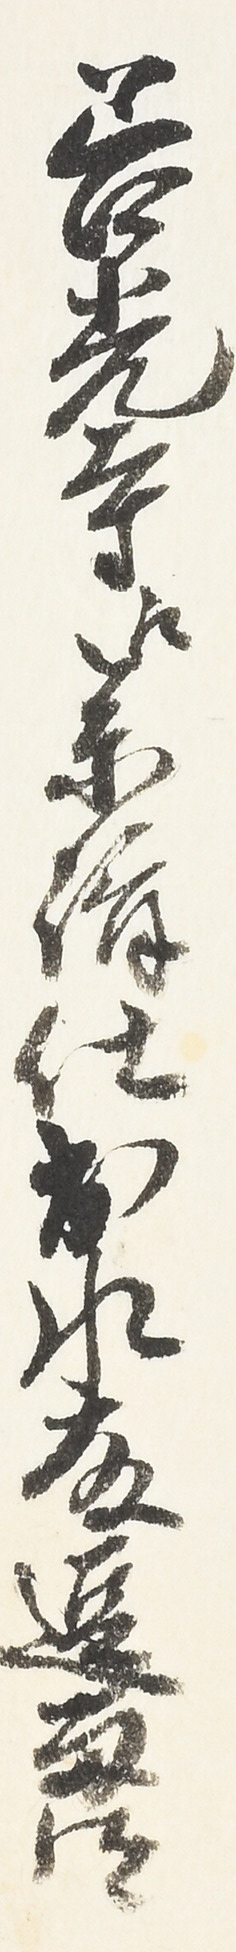善光寺江参詣仕出水殿逗留仕候
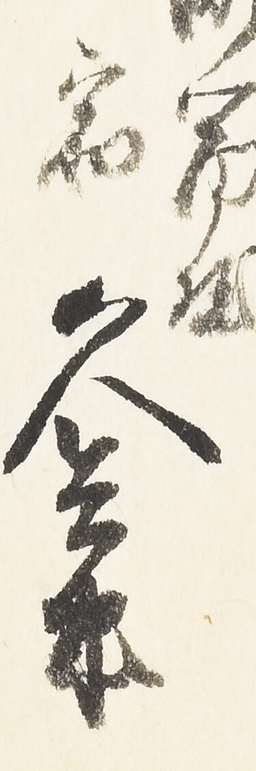宿久兵衛
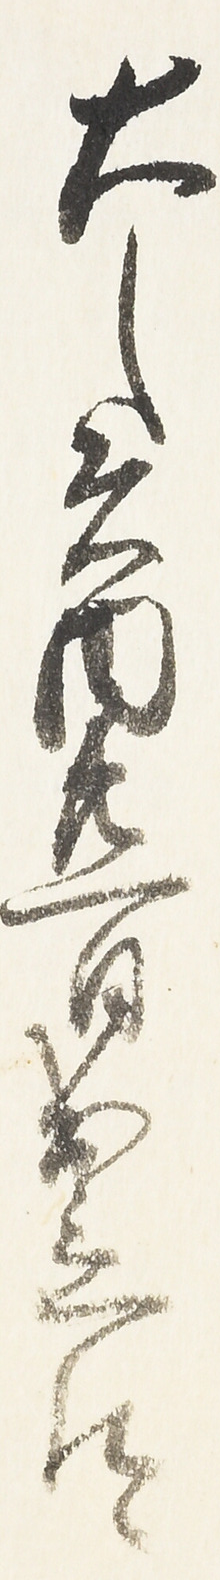右之者同廿一日出立仕候
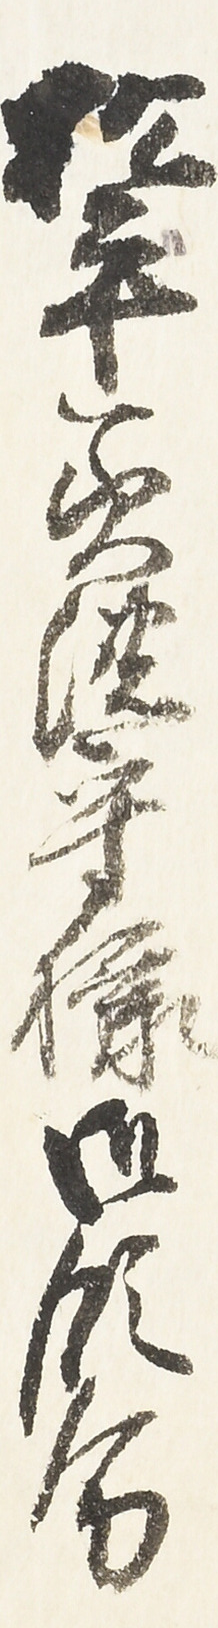松平美濃守様御領分
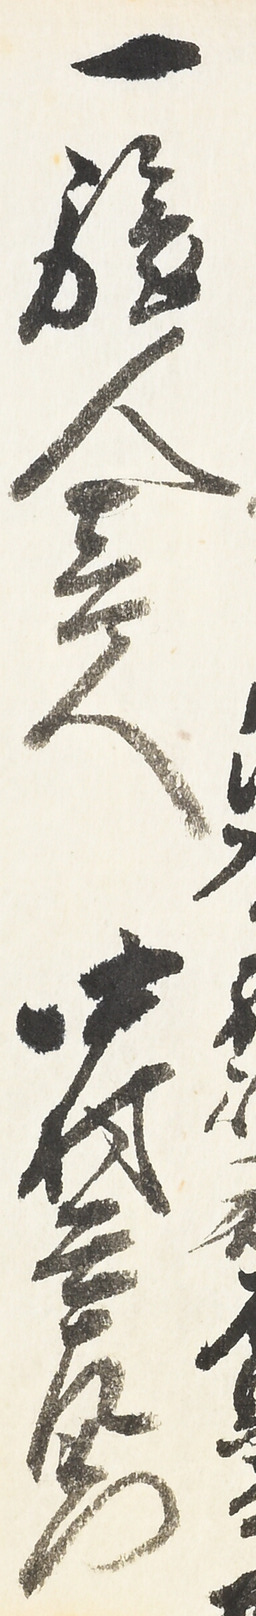一旅人壱人中村兵左衛門
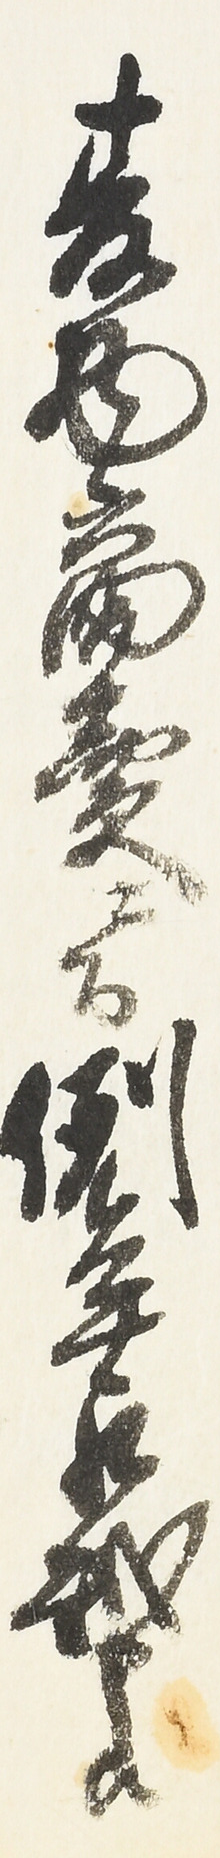夏物商売ニ而例年罷越申候
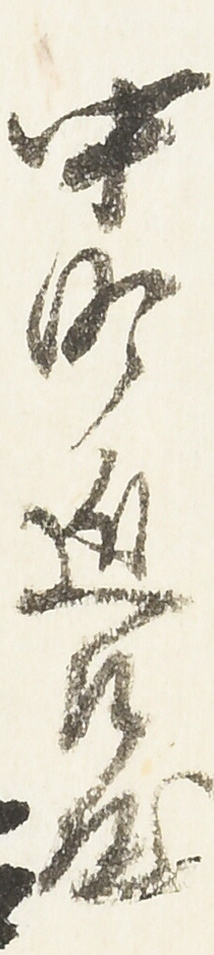中町近江屋
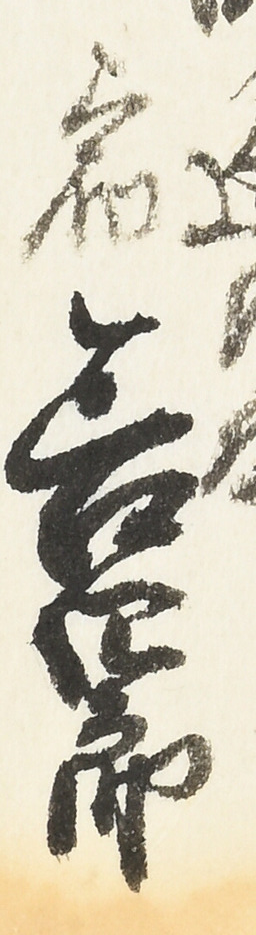宿善四郎
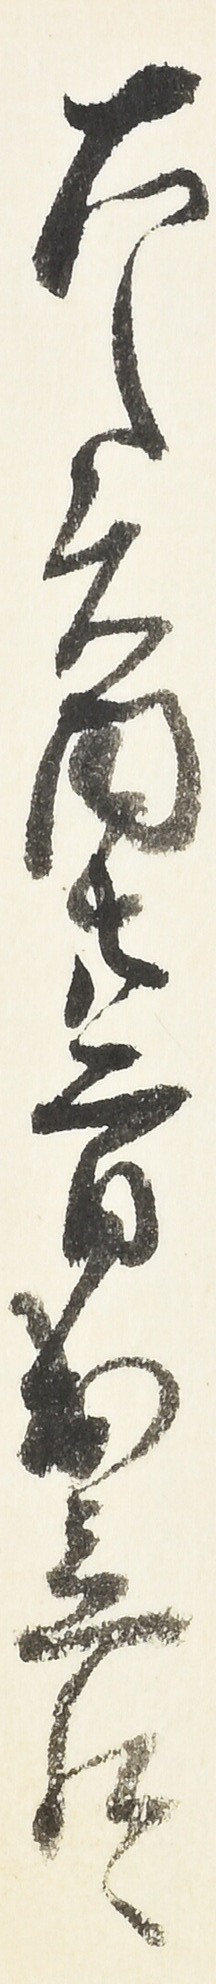右之者同廿二日出立仕候
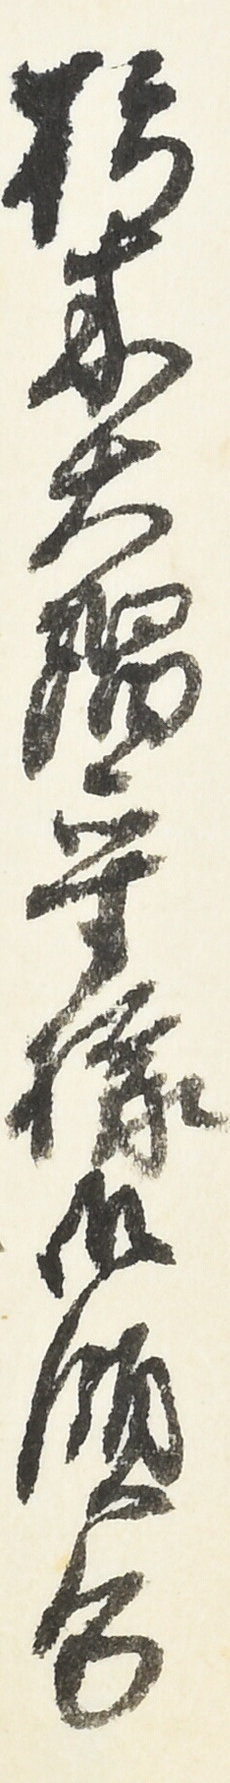朽木大隅守様御領分
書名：町中旅人泊控帳
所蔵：伊那市立高遠町図書館・合同会社AMANE
